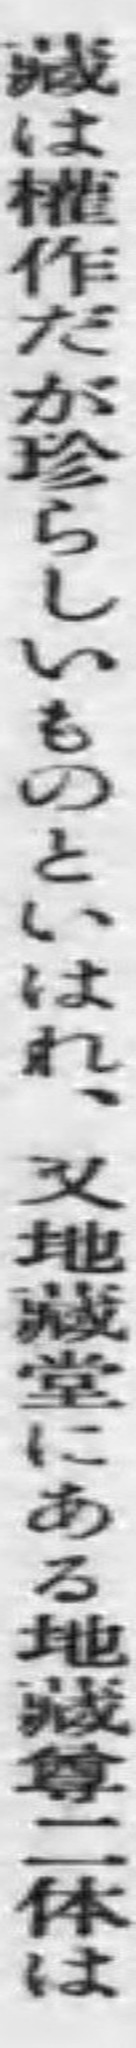蔵は権作だが珍らしいものといはれ、又地蔵堂にある地蔵尊二体は
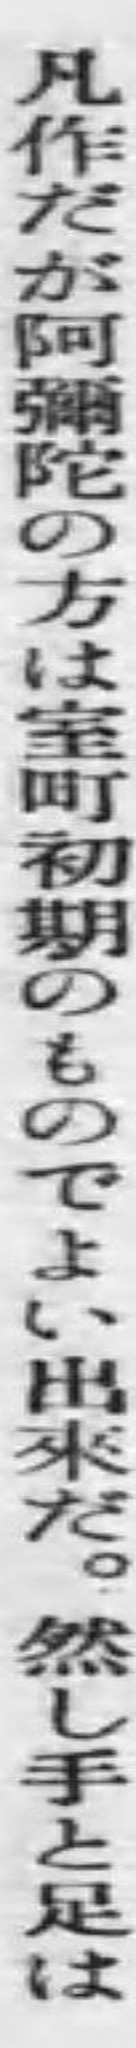凡作だが阿弥陀の方は室町初期のものでよい出来だ。然し手と足は
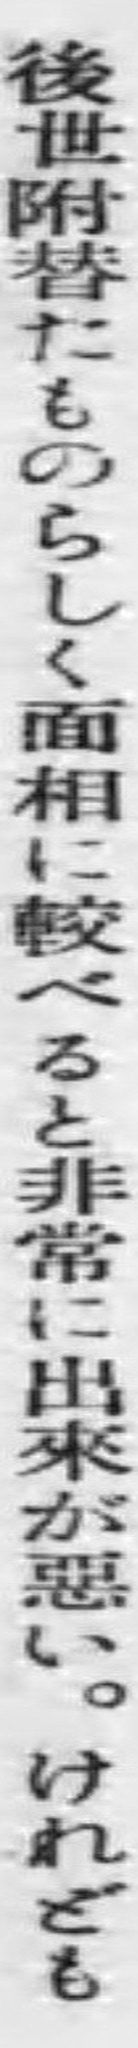後世附替たものらしく面相に較べると非常に出来が悪い。けれども
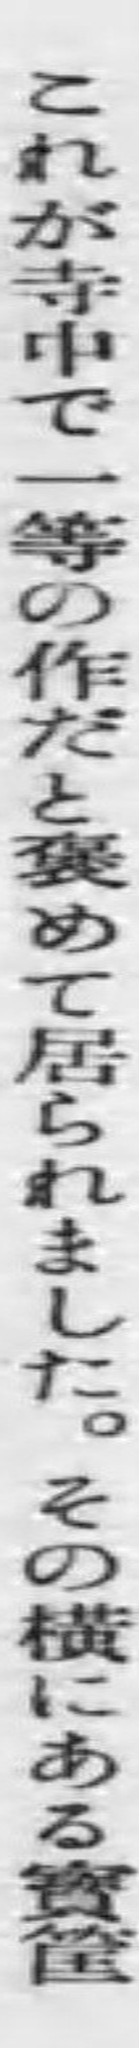これが寺中で一等の作だと褒めて居られました。その横にある宝筐
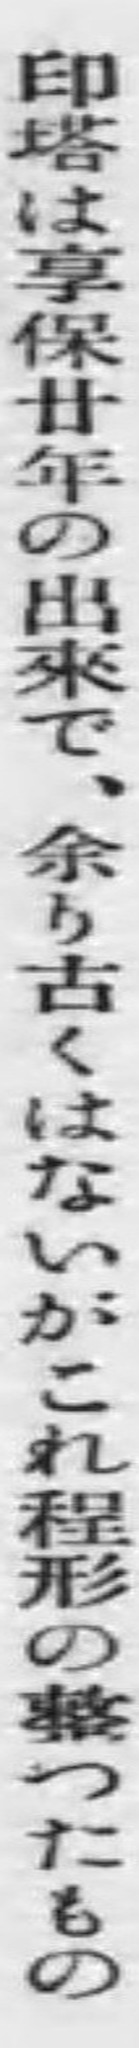印塔は享保廿年の出来で、余り古くはないがこれ程形の整つたもの
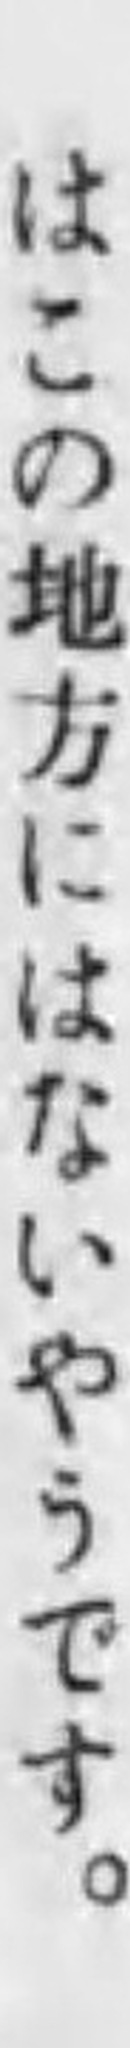はこの地方にはないやうです。
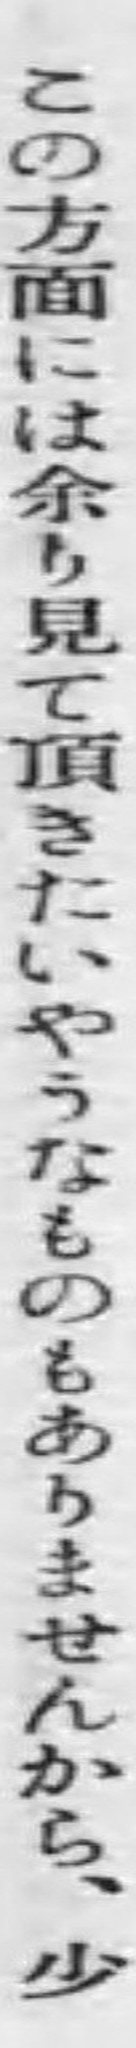この方面には余り見て頂きたいやうなものもありませんから、少
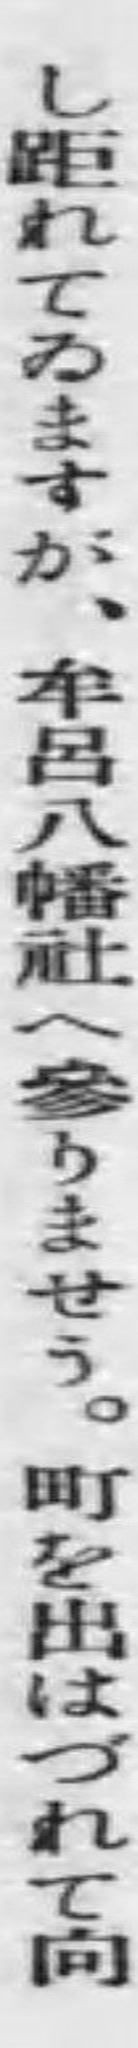し距れてゐますが、牟呂八幡社へ参りませう。町を出はづれて向
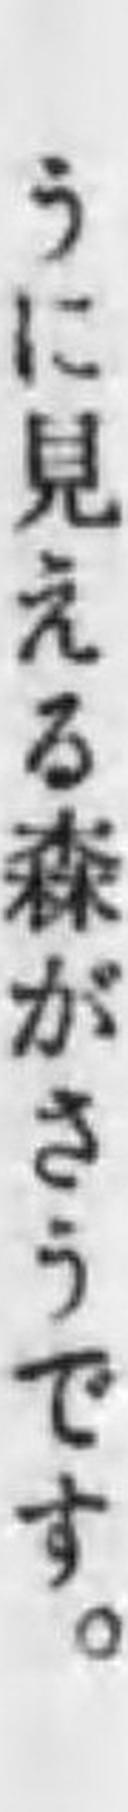うに見える森がさうです。
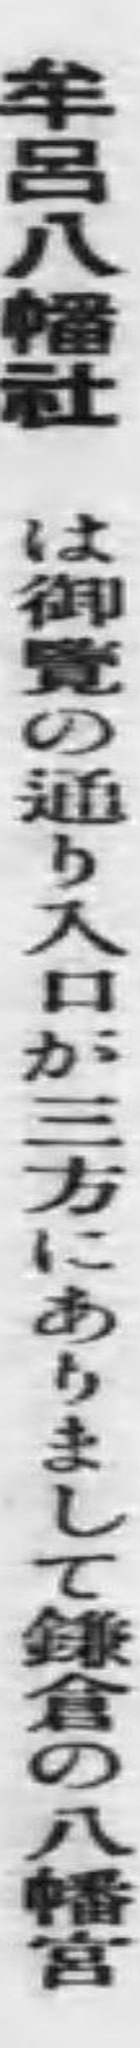牟呂八幡社は御覧の通り入口が三方にありまして鎌倉の八幡宮
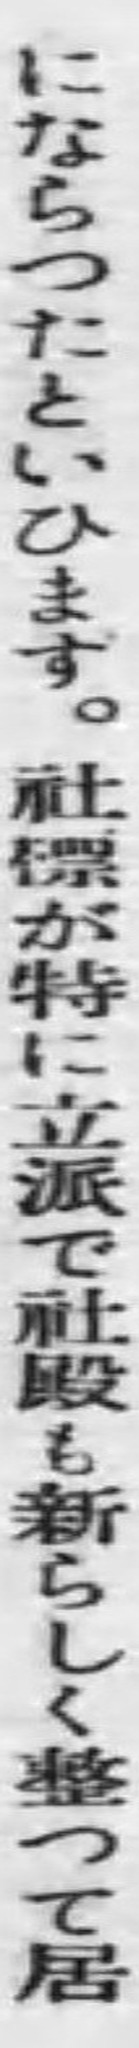にならつたといひます。社標が特に立派で社殿も新らしく整つて居
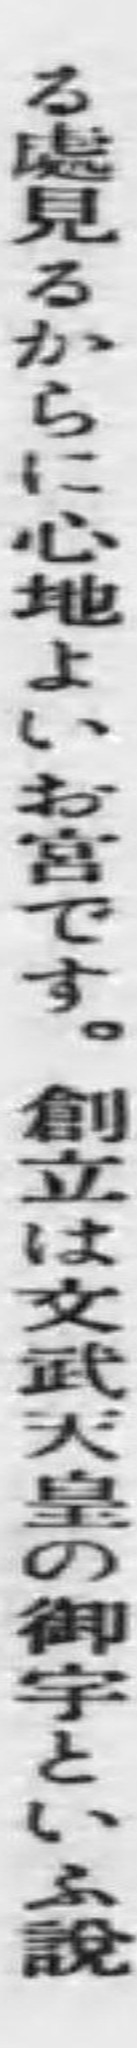る処見るからに心地よいお宮です。創立は文武天皇の御宇といふ説
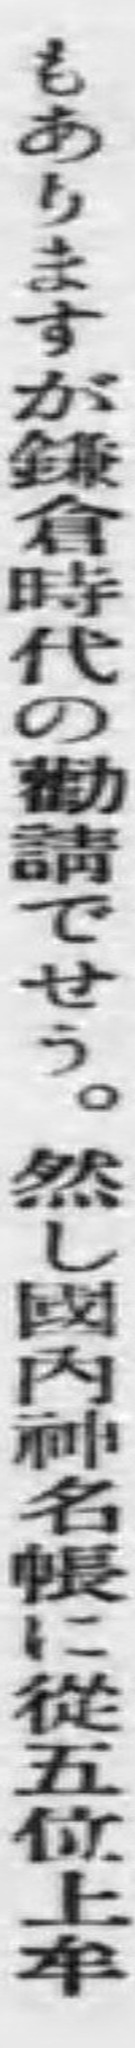もありますが鎌倉時代の勧請でせう。然し国内神名帳に従五位上牟
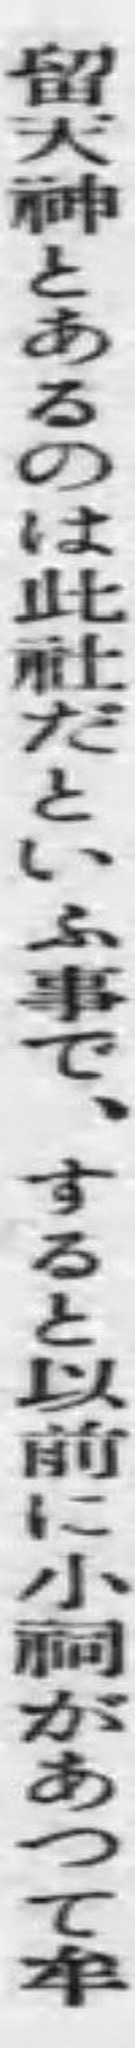留天神とあるのは此社だといふ事で、すると以前に小祠があつて牟
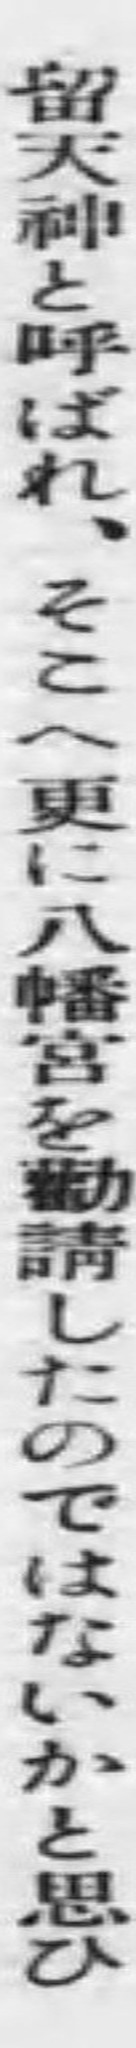留天神と呼ばれ、そこへ更に八幡宮を勧請したのではないかと思ひ
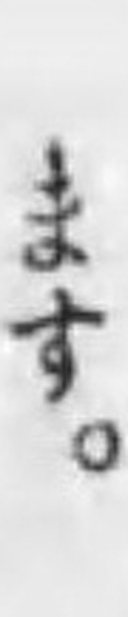ます。
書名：東三河道中記 : 豊橋市及其附近案内
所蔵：国立国会図書館 National Diet Library, JAPAN
